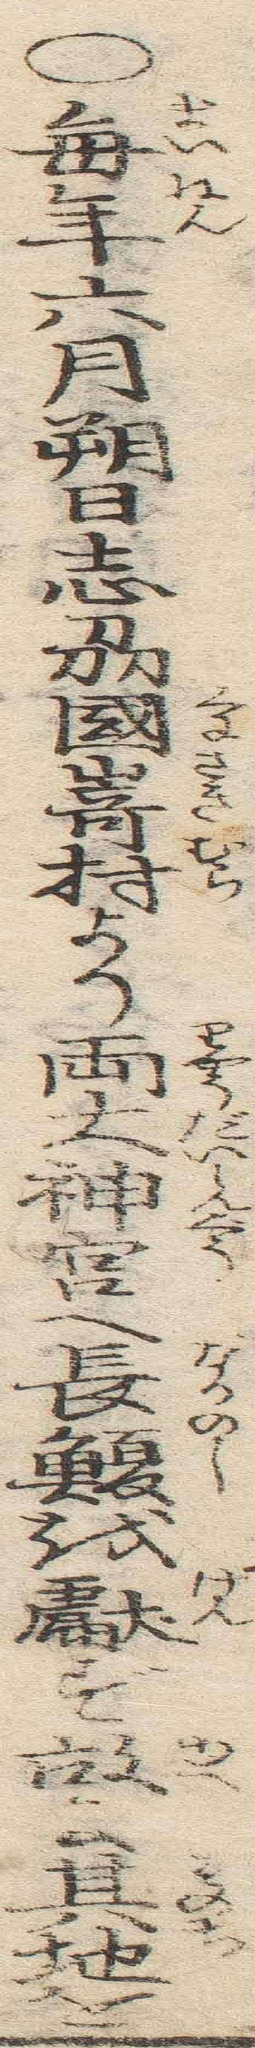○毎年六月朔日志州国崎村より両大神宮へ長鰒を献ず故に其地を
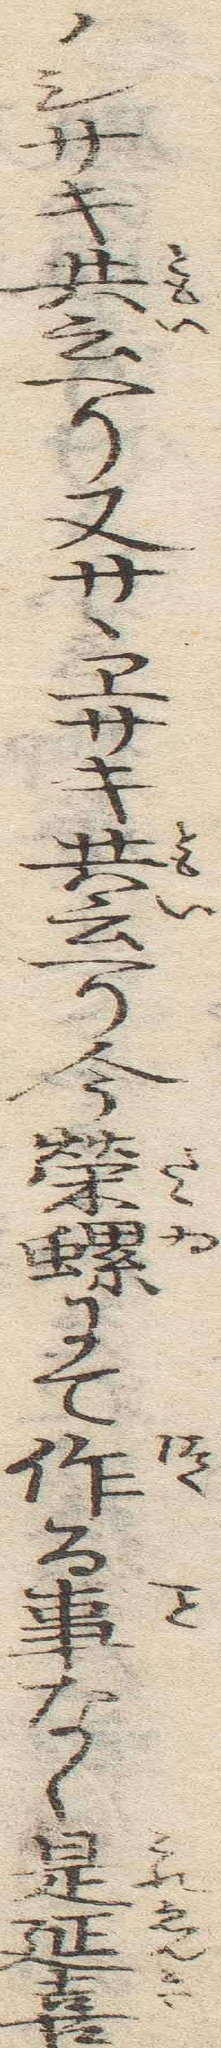ノシサキ共云へり又サヽヱサキ共云へり今栄螺にて作る事なし是延喜
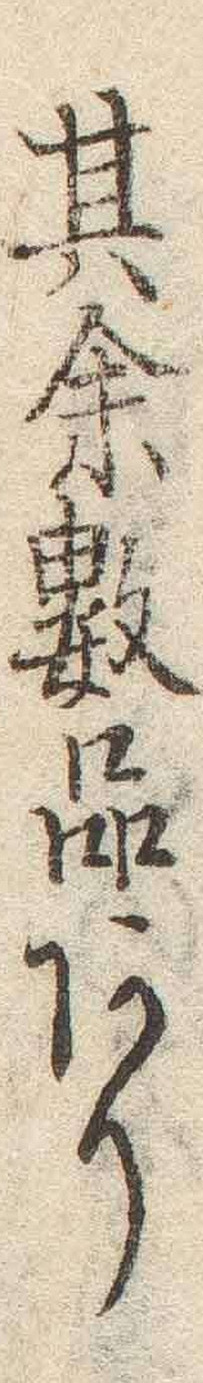其余数品あり
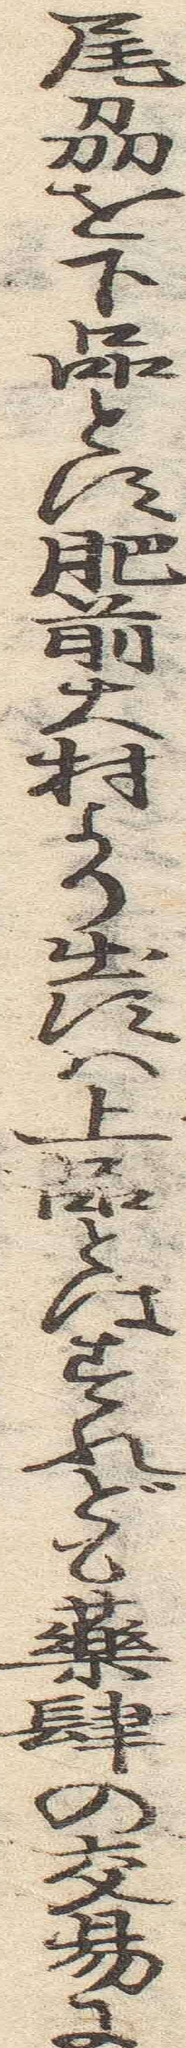尾州を下品とす肥前大村より出すは上品とはすれども薬肆の交易に
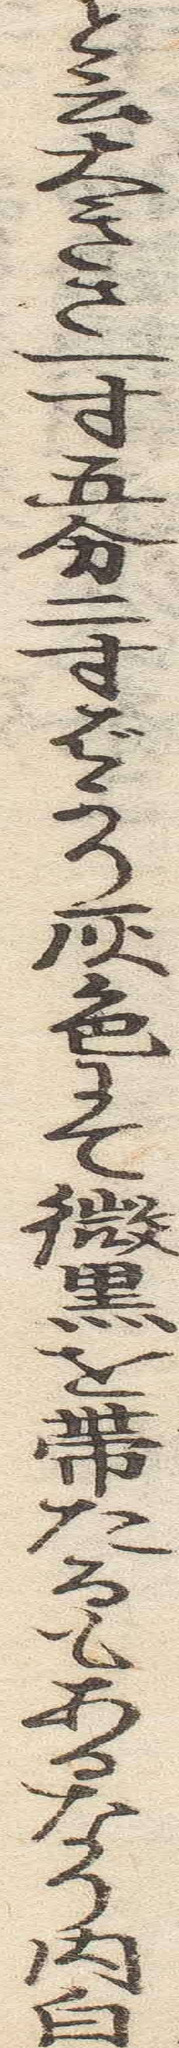と云大きさ一寸五分二寸ばかり灰色にて微黒を帯たるもあるなり内白
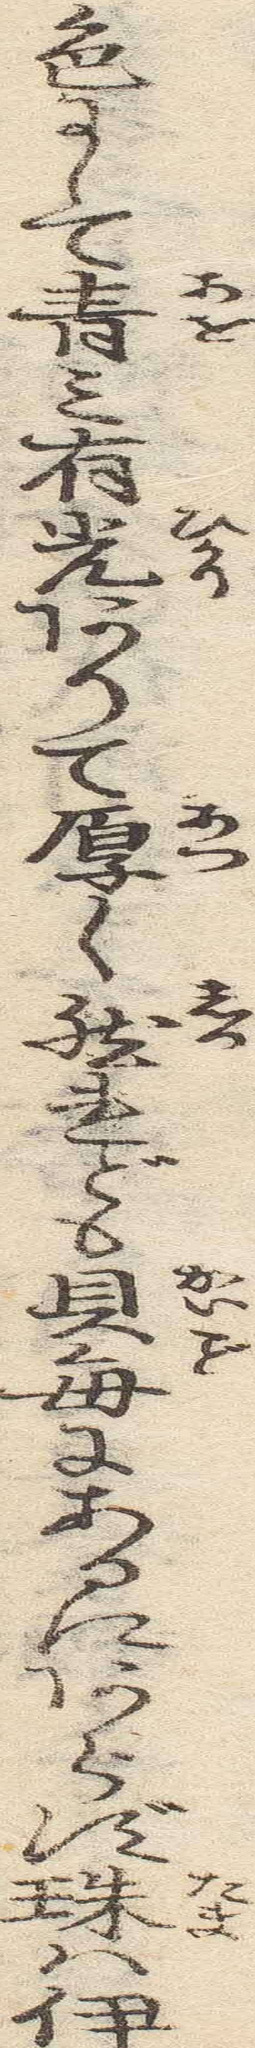色にして青み有光ありて厚し然れども貝毎にあるにあらず珠は伊
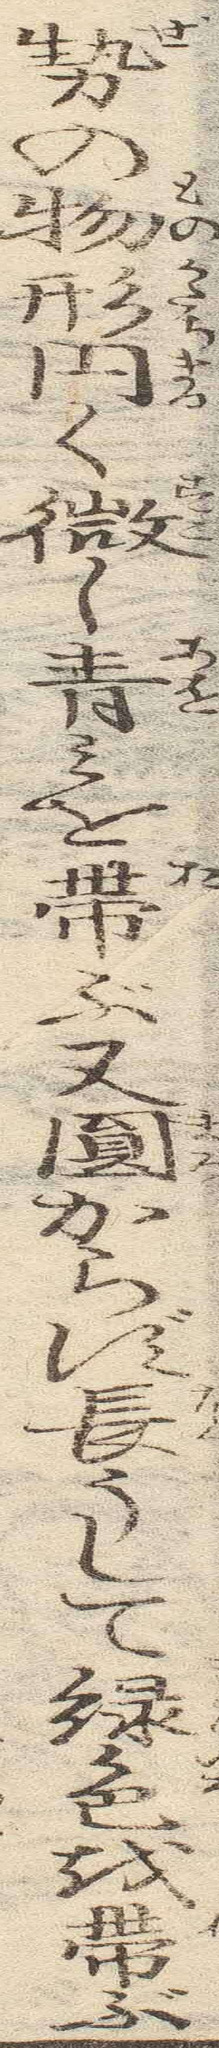勢の物形円く微し青みを帯ぶ又円からず長うして緑色を帯ぶ
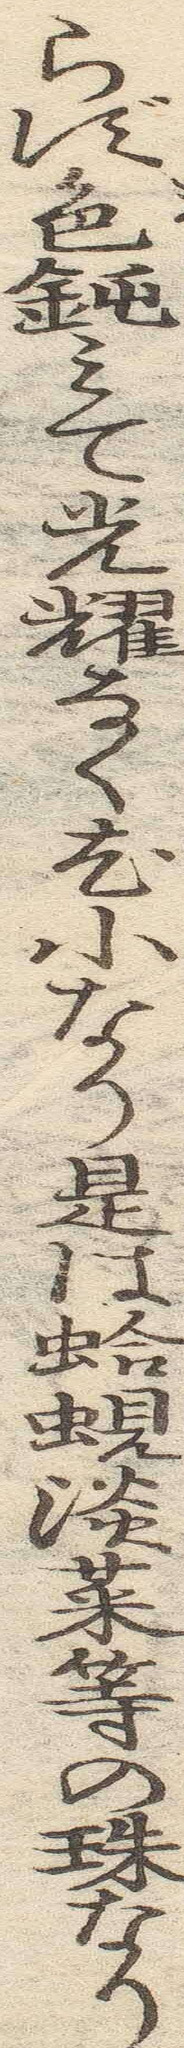らず色鈍みて光耀なく尤小なり是は蛤蜆淡菜等の珠なり
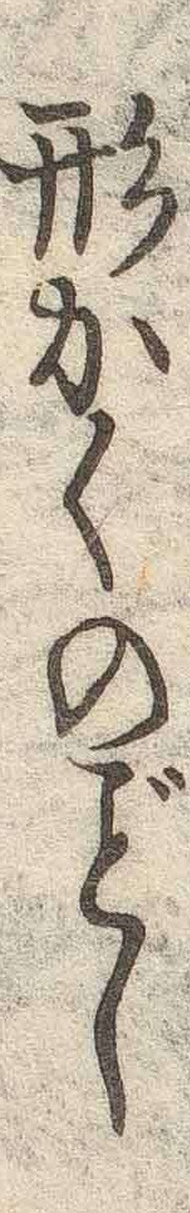形かくのごとく
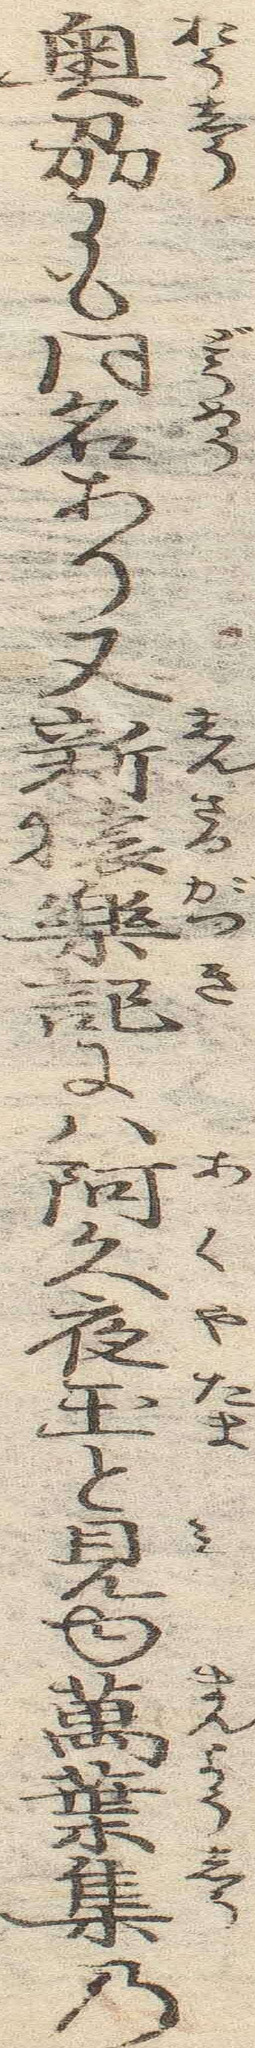奥州にも同名あり又新猿楽記には阿久夜玉と見ゆ万葉集の
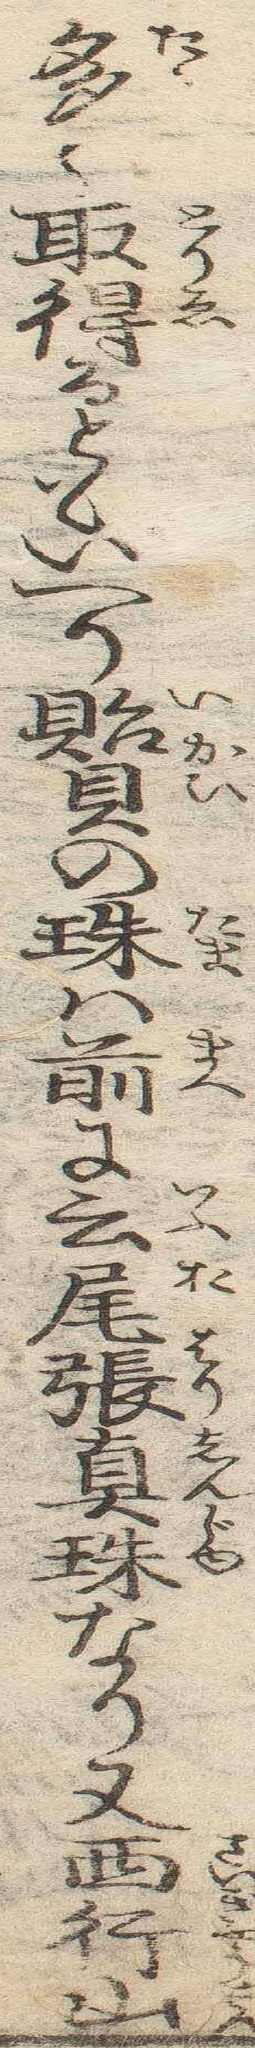多く取得るともいへり貽貝の珠は前に云尾張真珠なり又西行山
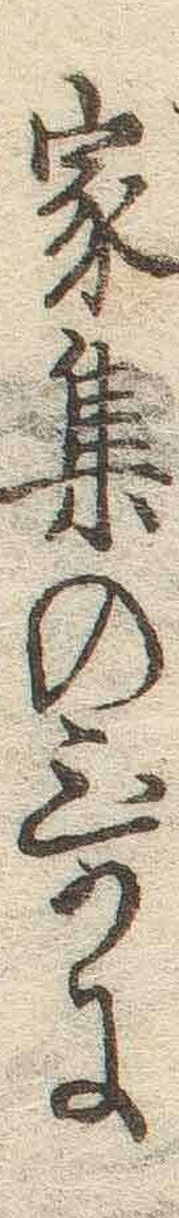家集の哥に
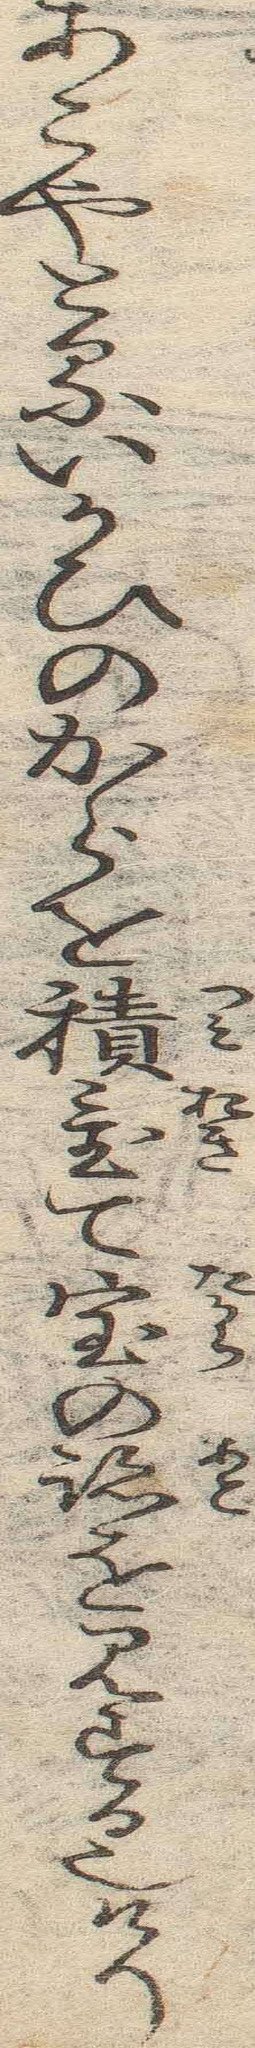あこやとるいかひのからを積置て宝の跡を見する也けり
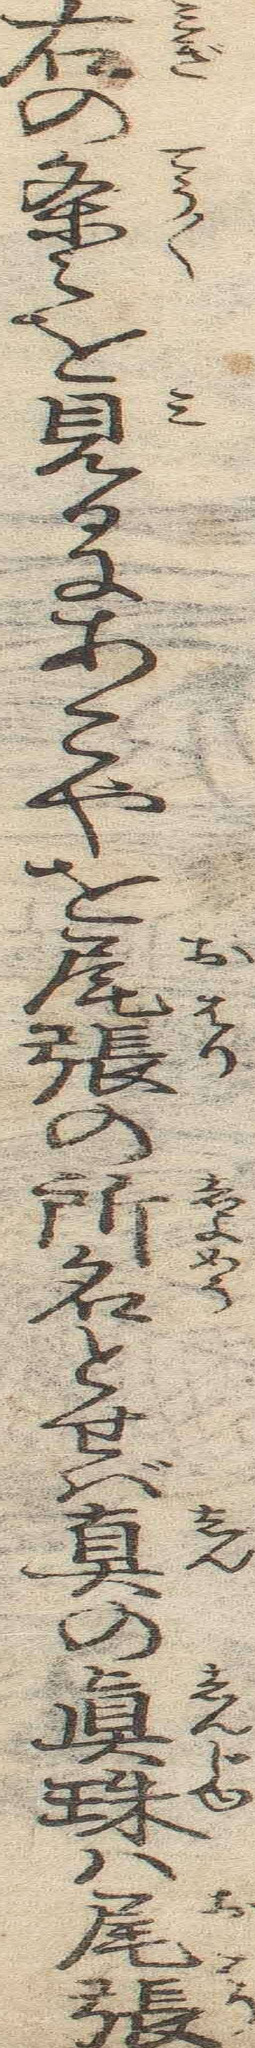右の条々を見るにあこやを尾張の所名とせば真の真珠は尾張
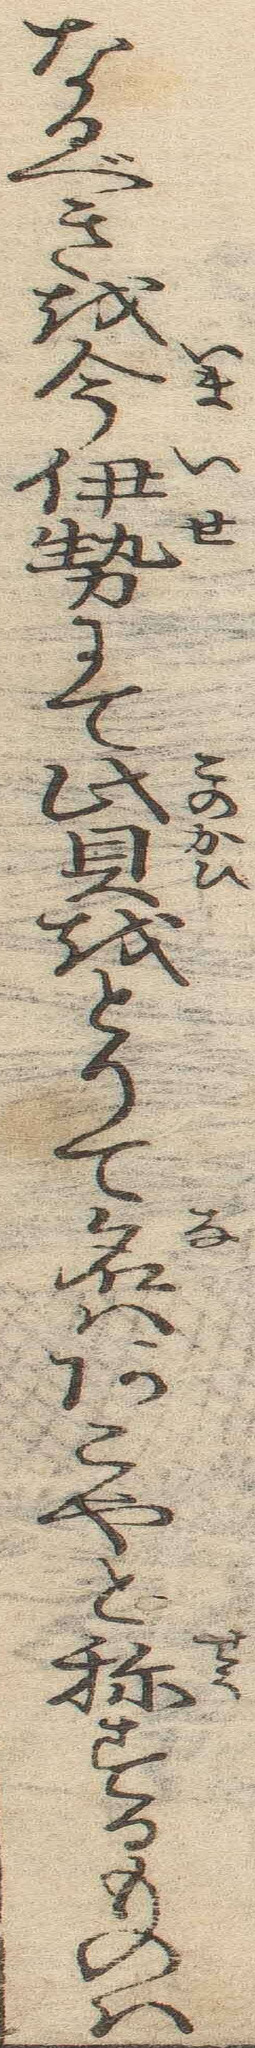なるべきを今伊勢にて此貝をとりて名はあこやと称するものは

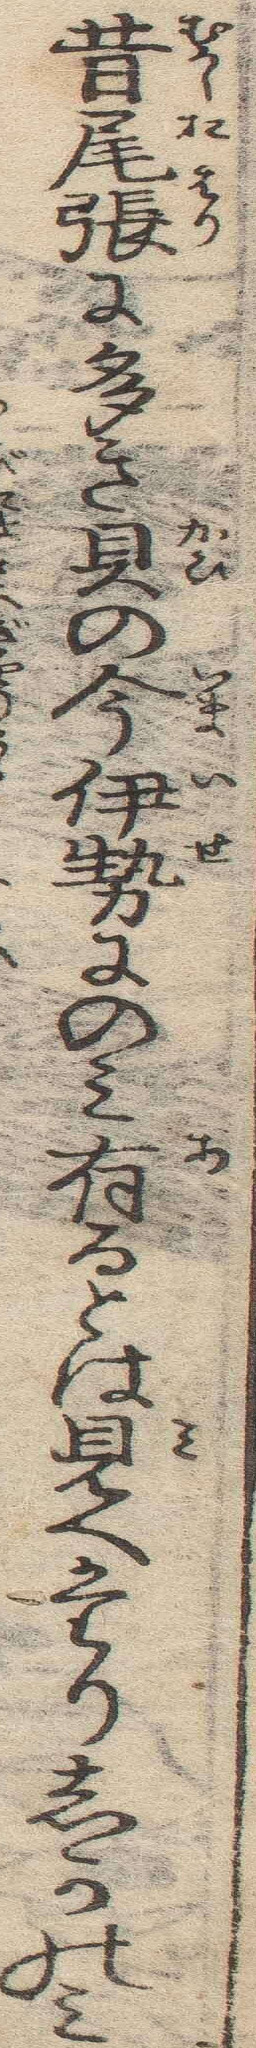昔尾張に多き貝の今伊勢にのみ有るとは見へたりしかのみ
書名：日本山海名産図会
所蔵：東京学芸大学附属図書館 国文学研究資料館
